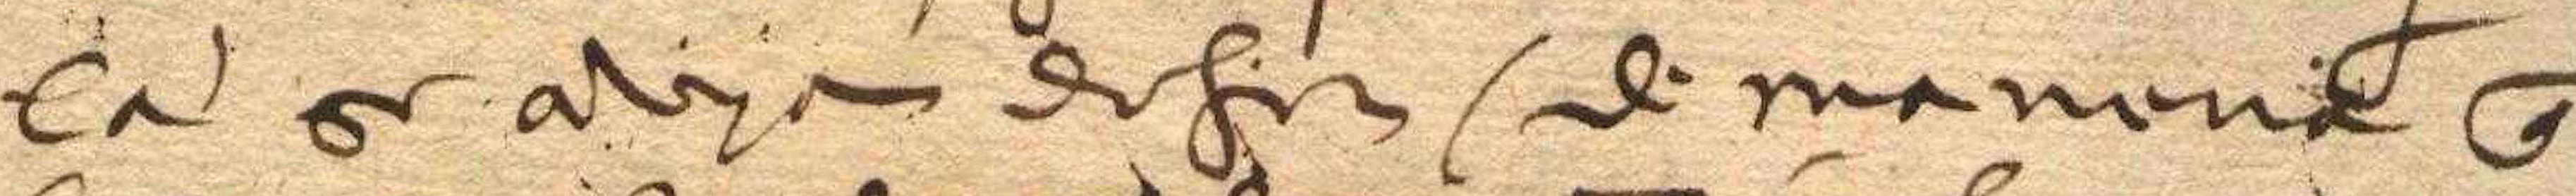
la se avya de hir / de maneira q̄
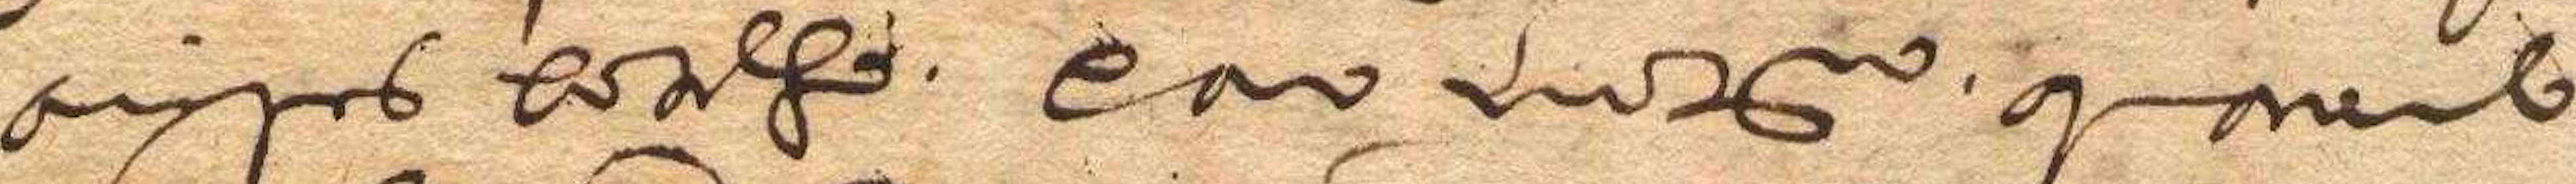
ayres botelho. e ao notro. quando
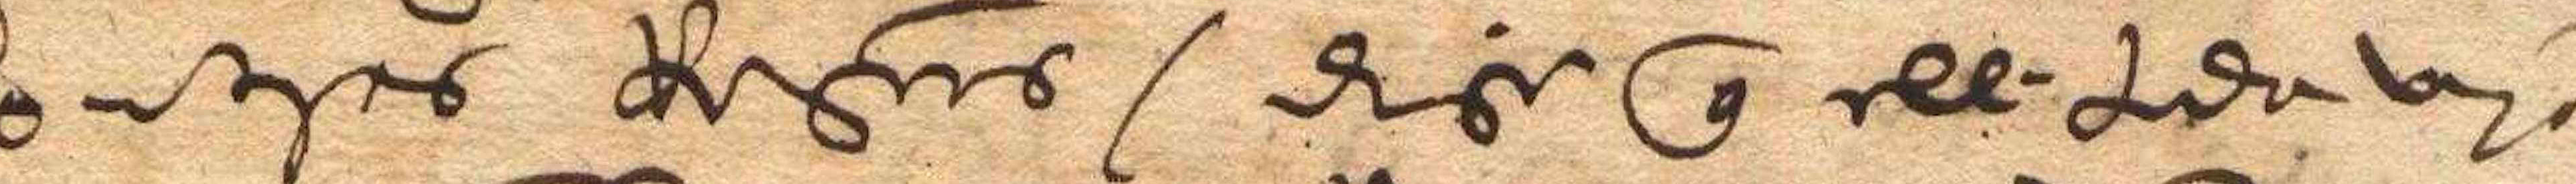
outras Rezões / dise q̄ elle todavya
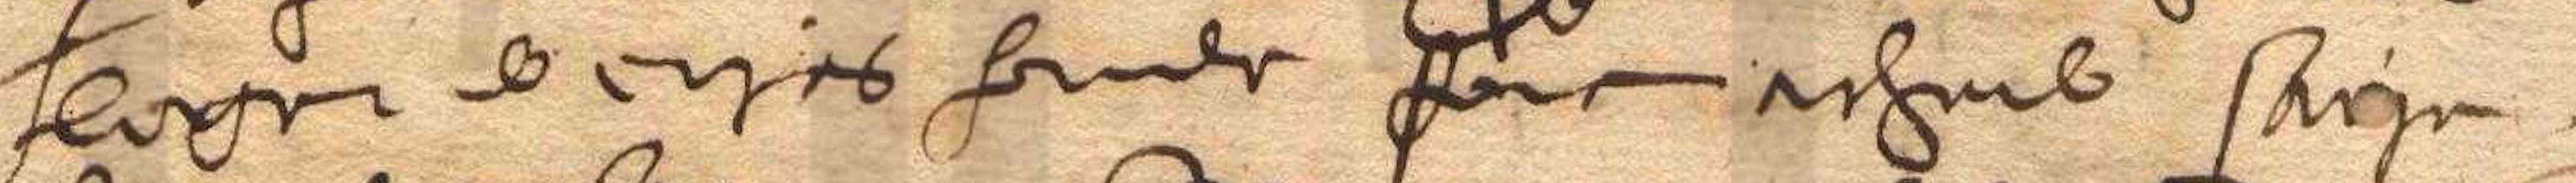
logar doeiras honde fora achado saira
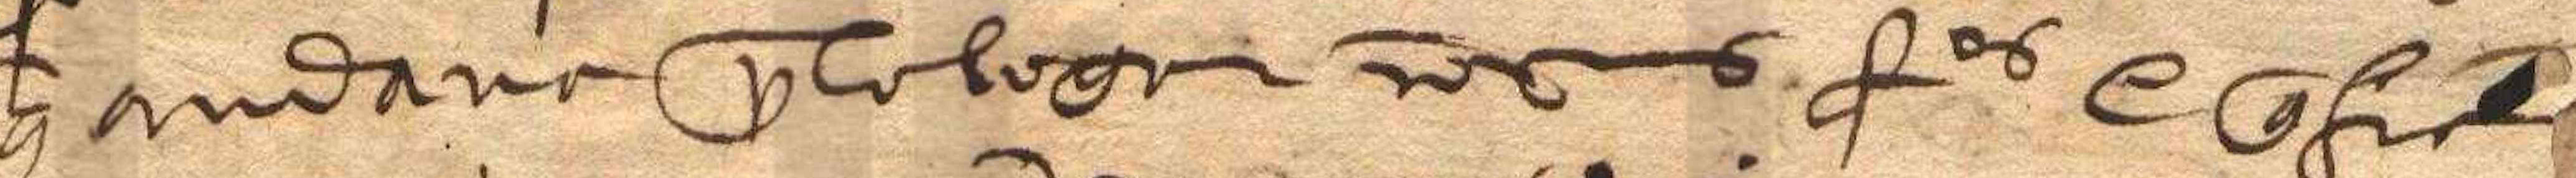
q̄ andaua p̄lo logar c̄o seus fos e q̄ hia
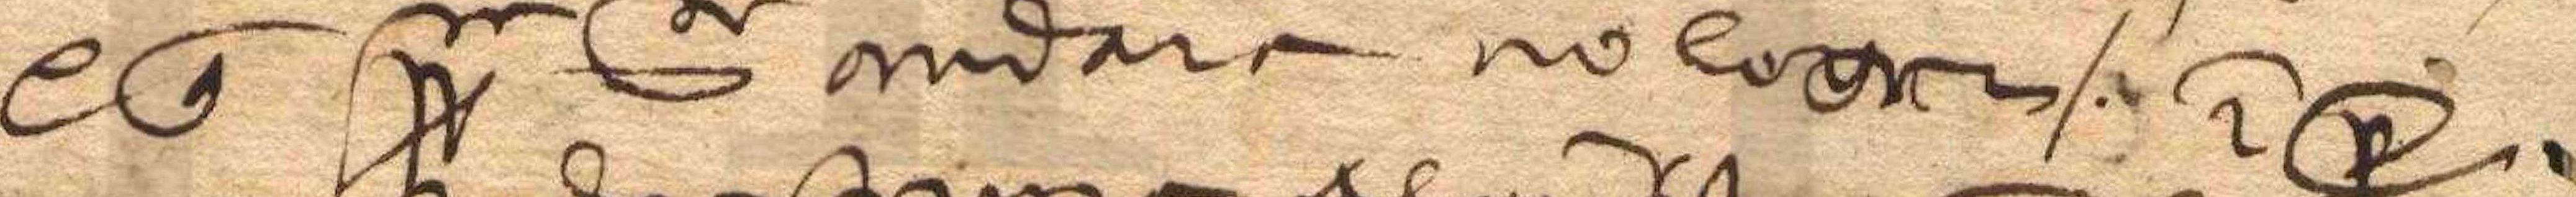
e q̄ ꝓpcamte andara no logar /. item p̄
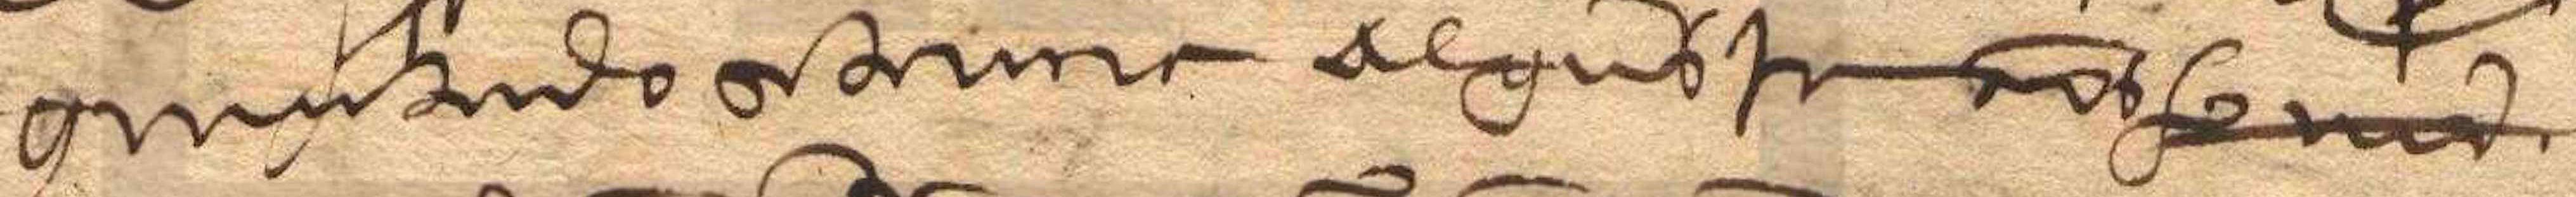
gumtado se teuera algūs Jrmãos homē.
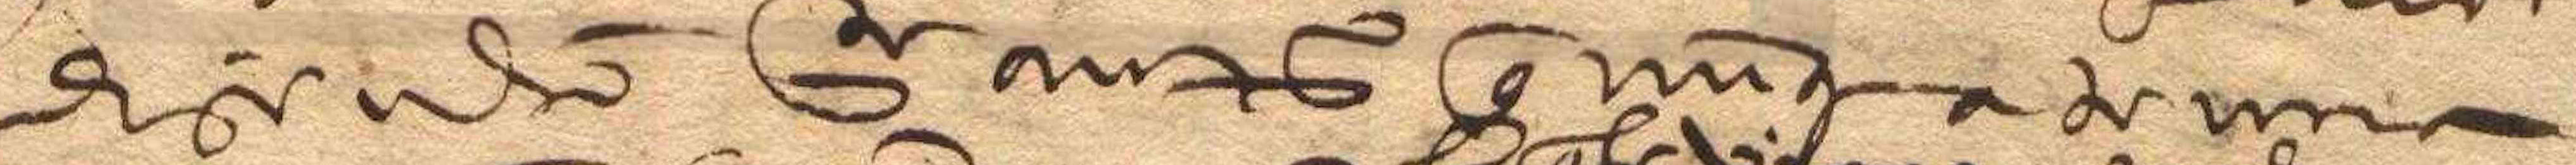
dise o dtō mte anto q̄ nūqua teuera
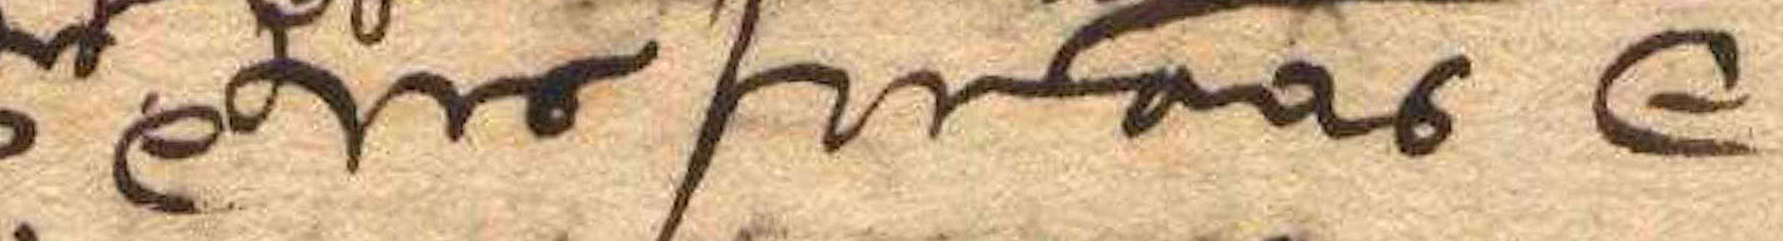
e tres Jrmāas E.
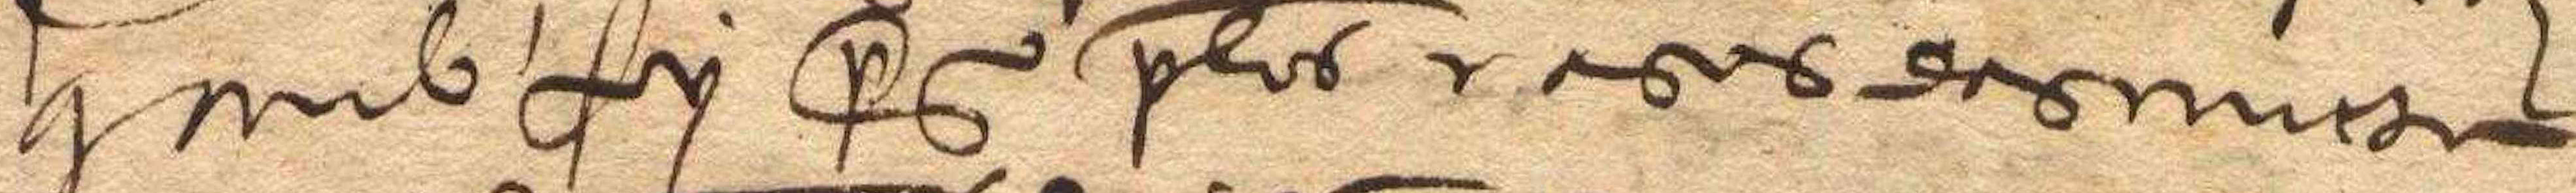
quando foy p̄so p̄los casos da sancta
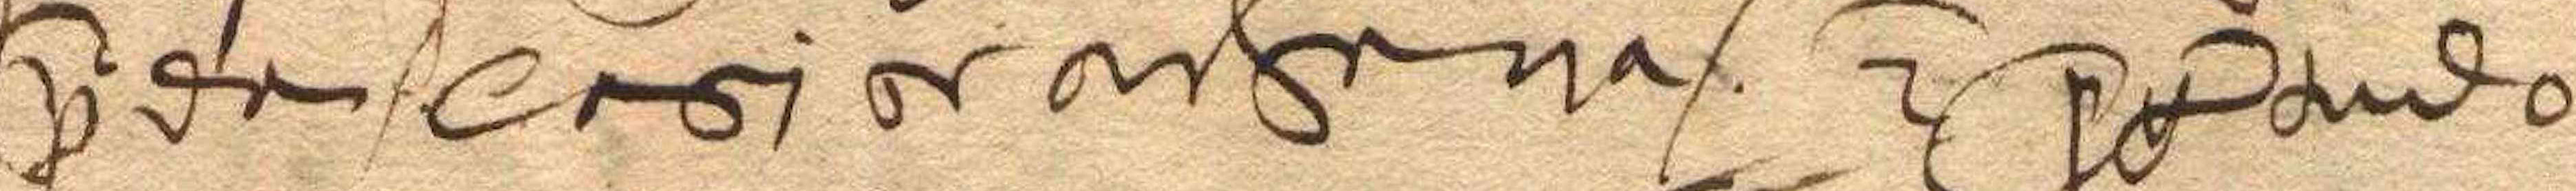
p̄ida / e asj se acharia /. item p̄gūtado
